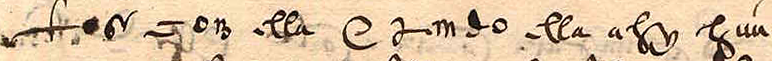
fose com ella e temdo ella ahy huū
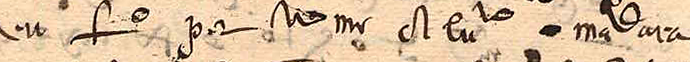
seu fo per nome Aluro o mādara
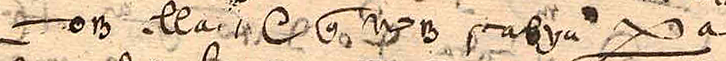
com ella / e q̄ nom sabya ꝑa
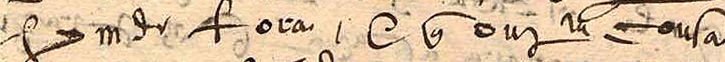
homde fora / e q̄ outra cousa
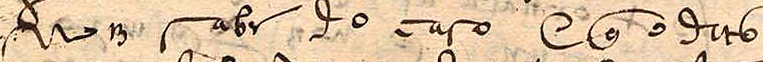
Nom sabe do caso e q̄ o ditō
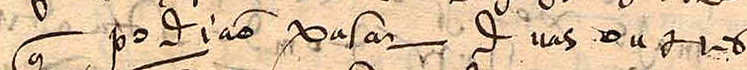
q̄ podião pasar duas ou tres
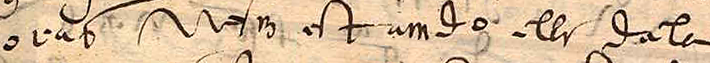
oras Nom estamdo elle decla
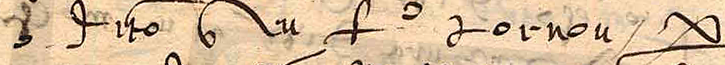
o dit̄o seu fo tornou / ꝑ
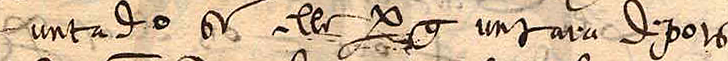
guntado se elle ꝑguntara depois
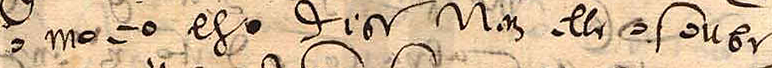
o moço lho dise Nem elle o soube
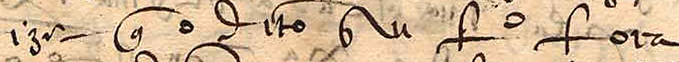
dizer q̄ o dit̄o seu fo fora
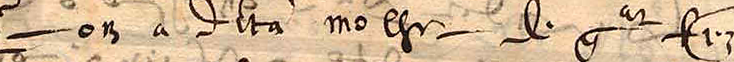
com a dit̄a molher de gar fr̄z
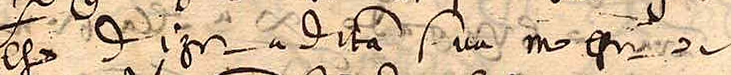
lho dizer a dit̄a sua molher ou
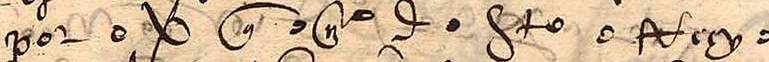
por o Ꝟ q̄ o m̄ro do Sto officyo
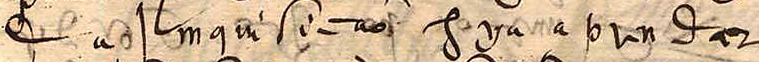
da Jmquisicaõ hya a prender
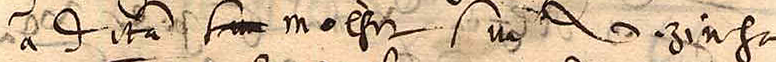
a dita sua molher sua Vezinha
